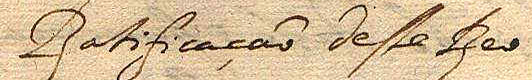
Ratificaçaõ deste Reo
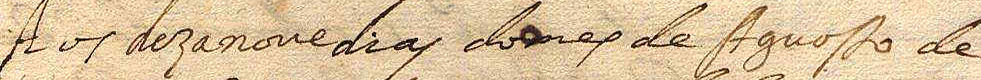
Aos dezanoue dias do mes de Aguosto de
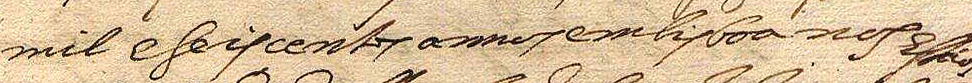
mil e seiscentos annos em lisboa nos Estaos
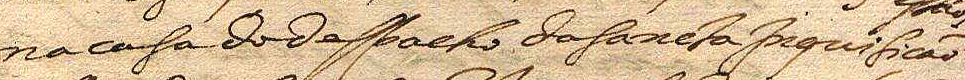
na casa do despacho da sancta Jnquisiçaõ
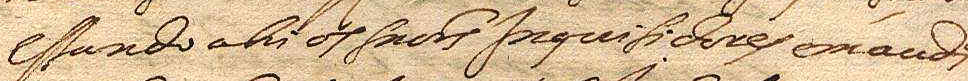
estando ahi os snors̄ Jnquisidores em audi.a
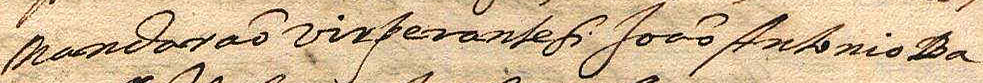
Mandaraõ vir perante si Joaõ Antonio Ba
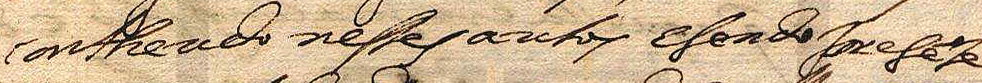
contheudo nestes autos E sendo presēte
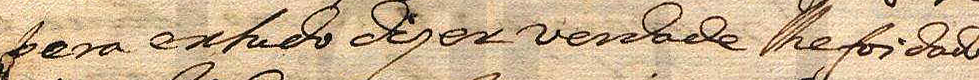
pera en tudo dizer verdade lhe foi dado
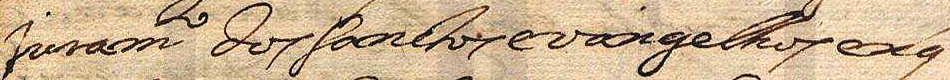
juramto dos sanctos evangelhos en q̄
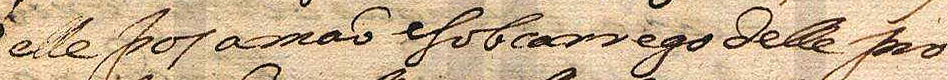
elle pos a maõ e sob carrego delle pro
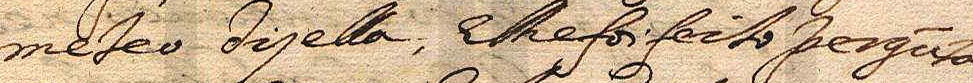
meteo dizella, E lhe foi feito pergūta
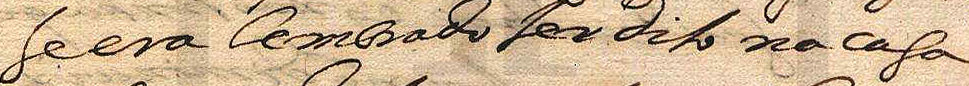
se era lembrado ter dito na casa
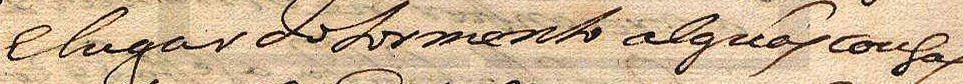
E lugar do tormento alguās cousas
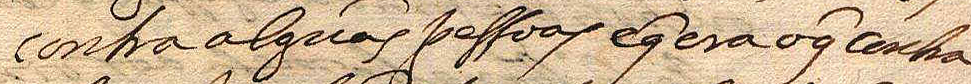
contra alguās pessoas e q̄ era o q̄ contra
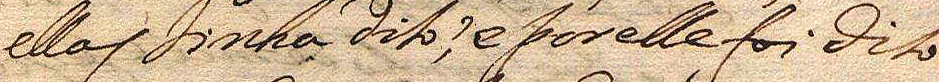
ellas tinha dito? e por elle foi dito
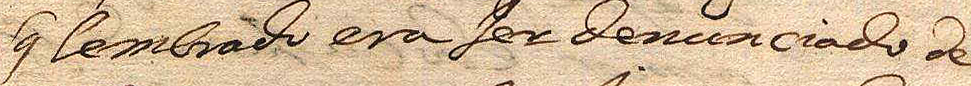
q̄ lembrado era ter denunciado de
